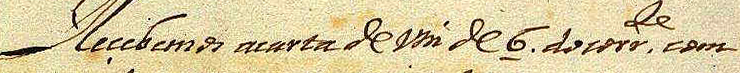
Recebemos a carta de v me de 6. do corr.te com
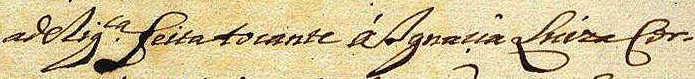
a delig.ca feita tocante à Ignacia Luiza Cor
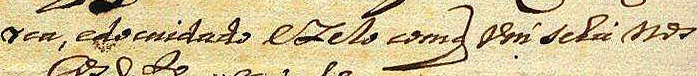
rea, e do cuidado e Zelo com q̄ v m̄ se há nos
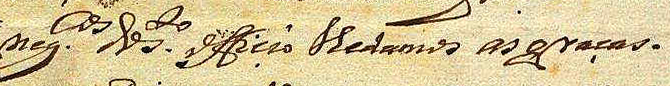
neg.cos do s.to officio lhe damos as graças.
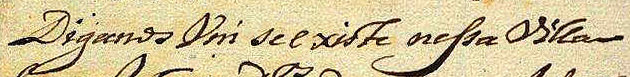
Diganos V m̄ se existe nessa Villa
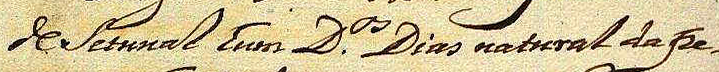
de Setuual hum D.os Dias natural da fre
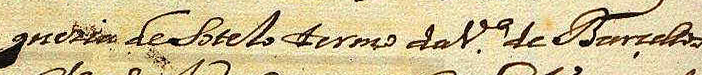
guezia de Sotelo termo da V.a de Barcellos
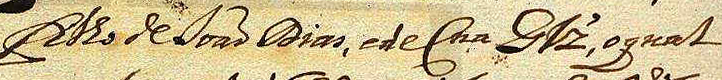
filho de Ioão Dias, e de Cna Glz̄, o qual
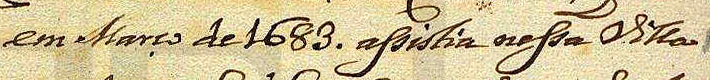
em Março de 1683. assistia nessa Villa
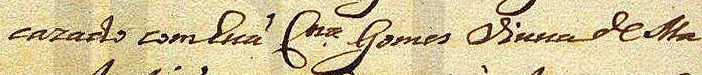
cazado com huā Cna. Gomes Viuua de Ma
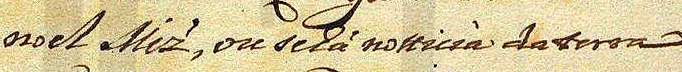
noel Miz̄, ou se há notticia da terra
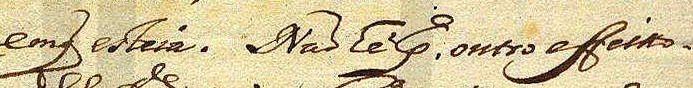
em q̄ esteia. Naõ he p.a outro effeito.
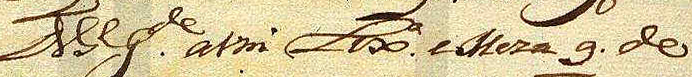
Ds̄ g.de a v m̄ Lix.a e Meza 9. de
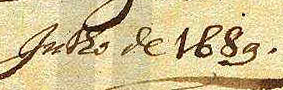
Julho de 1689.
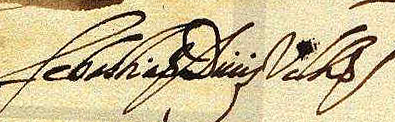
Sebastiaõ Diniz Velho
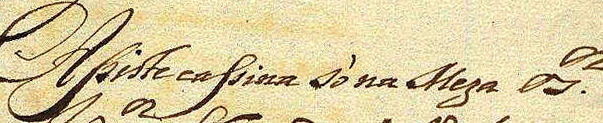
Assiste e assina só na Meza o s.or
